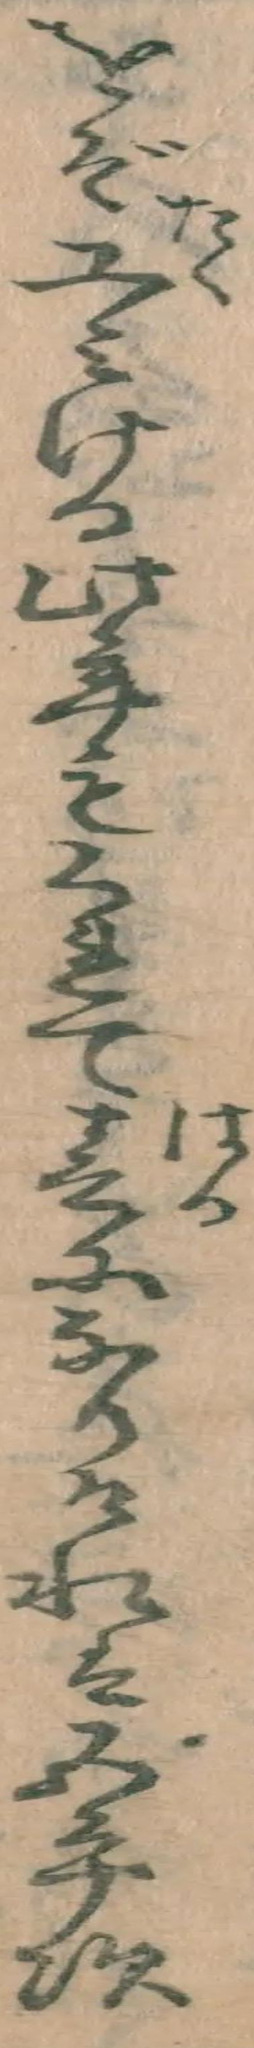をぞ工みける此年もくれて春になりけれは五平次
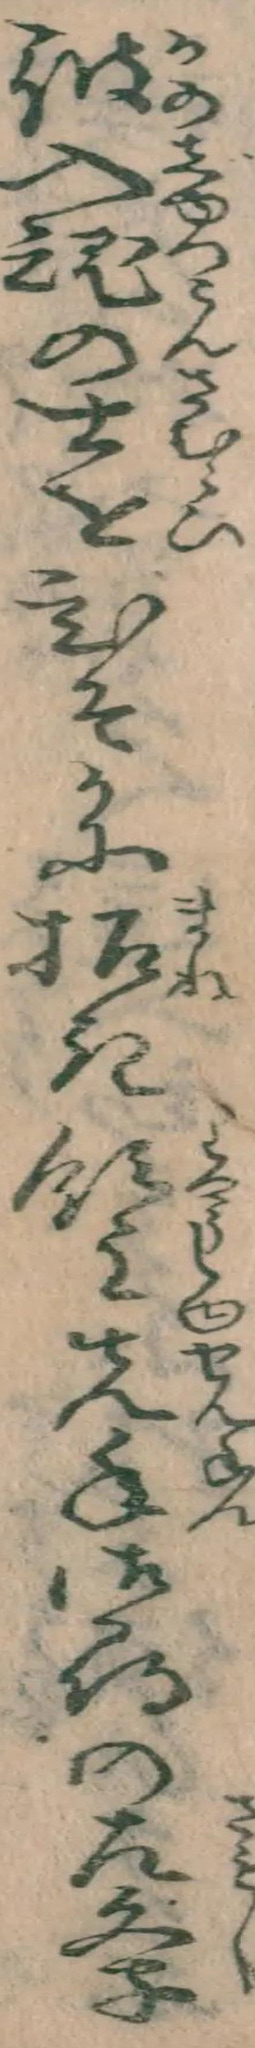彼入魂の士をひそかに招き領主先年御尋の左文字
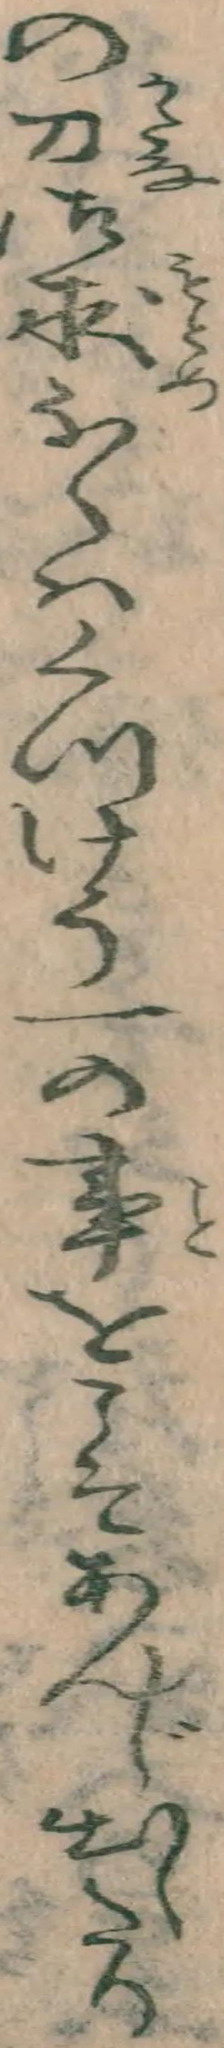の刀御求なくはくつけう一の事をこそあんじ出したり
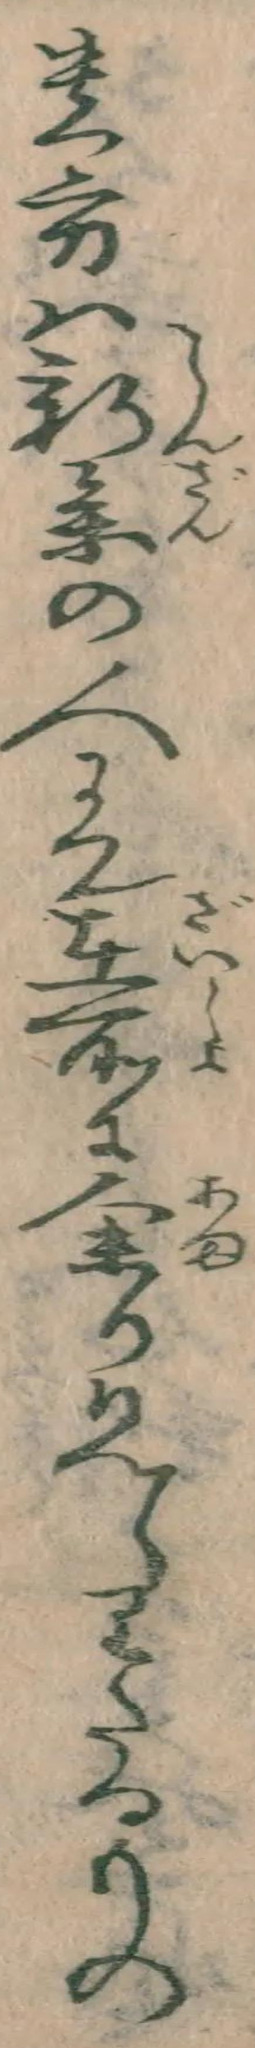貴方は新参の人にて在所に余り見しりたるもの
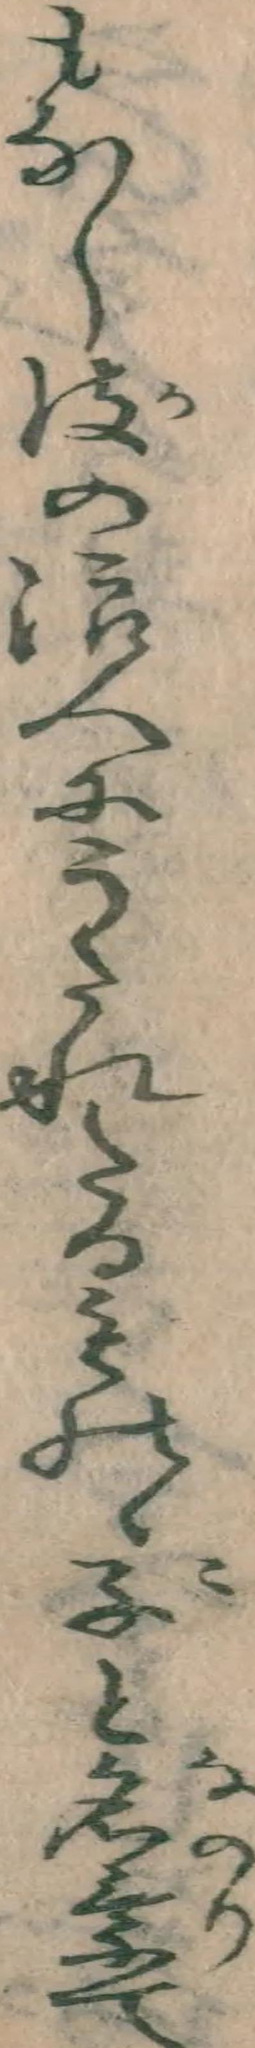もなし彼の浪人にうたれたるものゝ子と名乗て
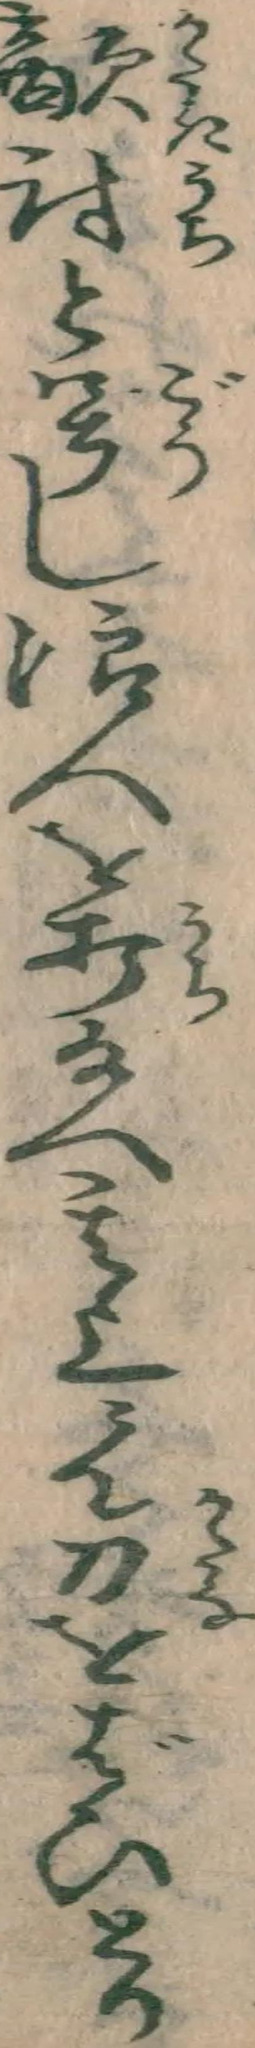敵討と号し浪人を打給へ其上にて刀をばひとり
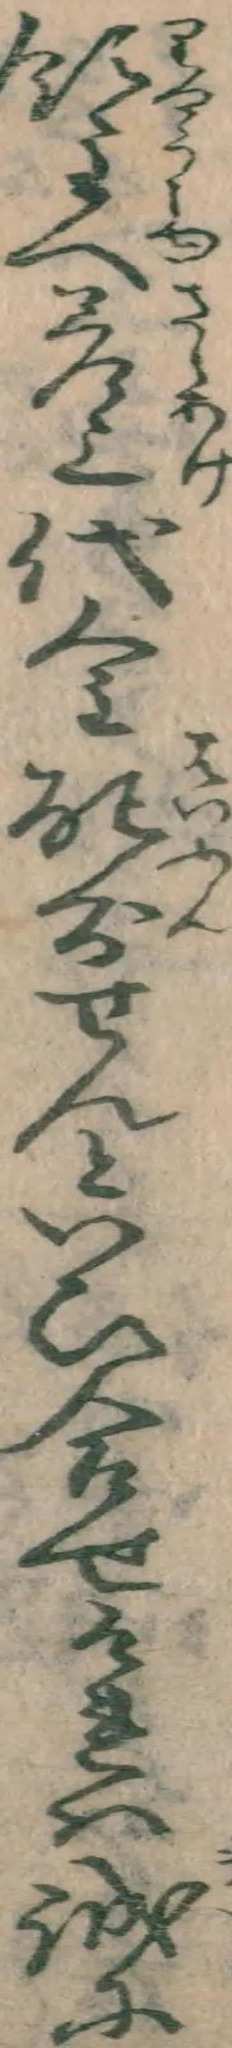領主へ差上代金配分せんといひ合せけれは誠に
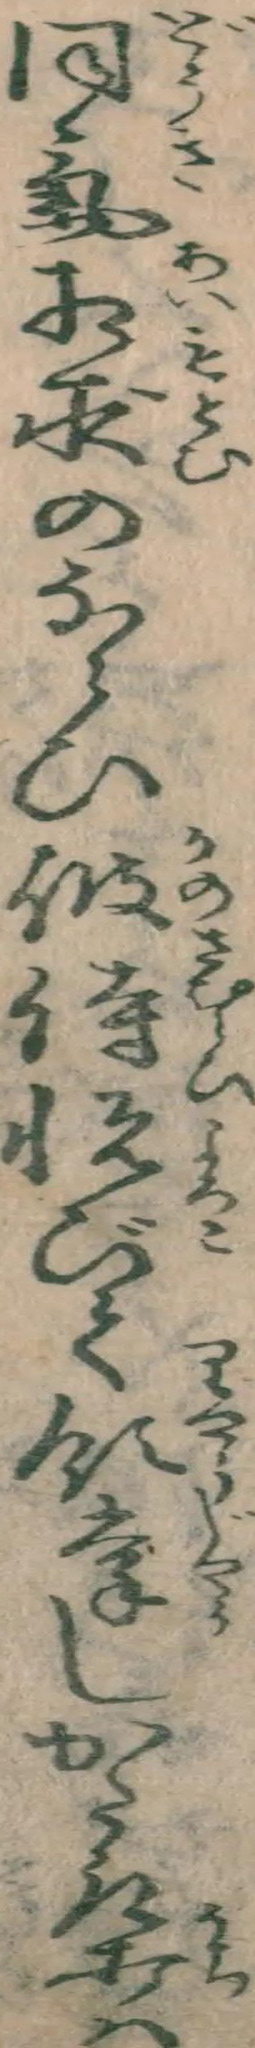同気相求のならひ彼侍悦びて領掌しかたき打は
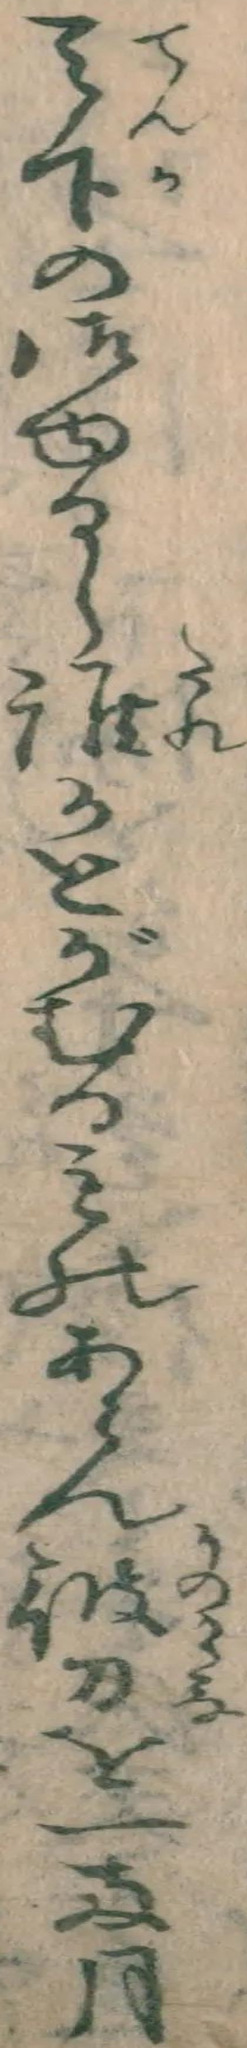天下の御ゆるし誰かとがむるものあらん彼刀を一両月
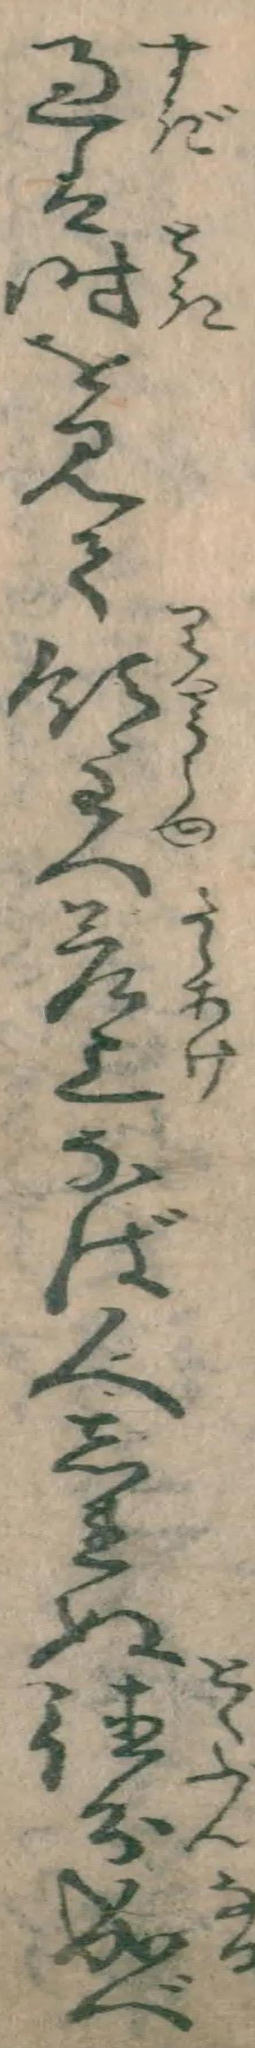過は時を見て領主差上なば人しれぬ徳分成べ
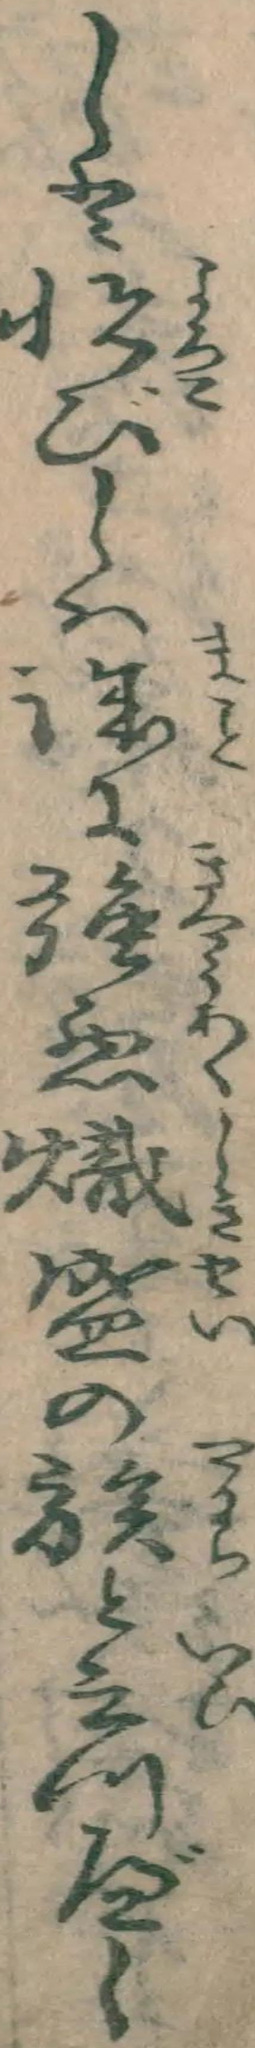しと悦びしは誠に強悪熾盛の族と云つべし

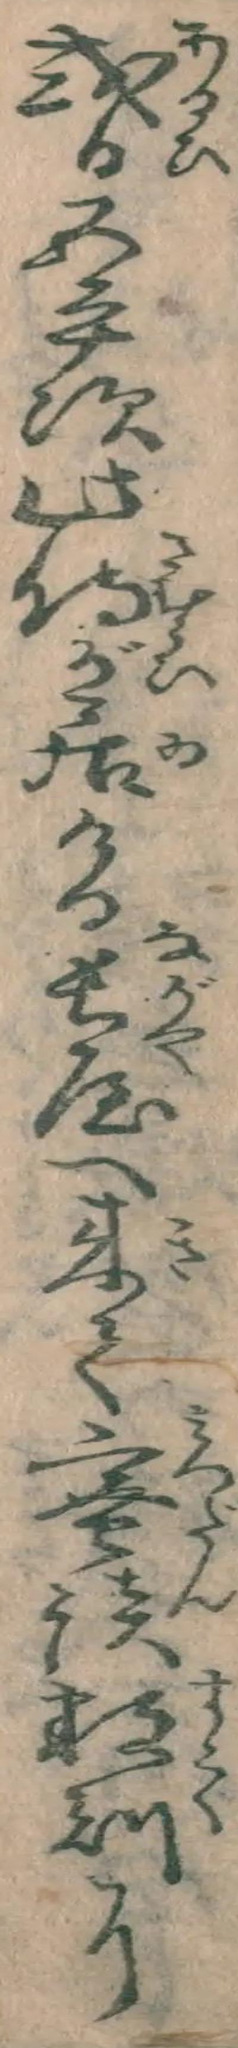或日五平次此侍居ける長屋へ来て密談数刻に
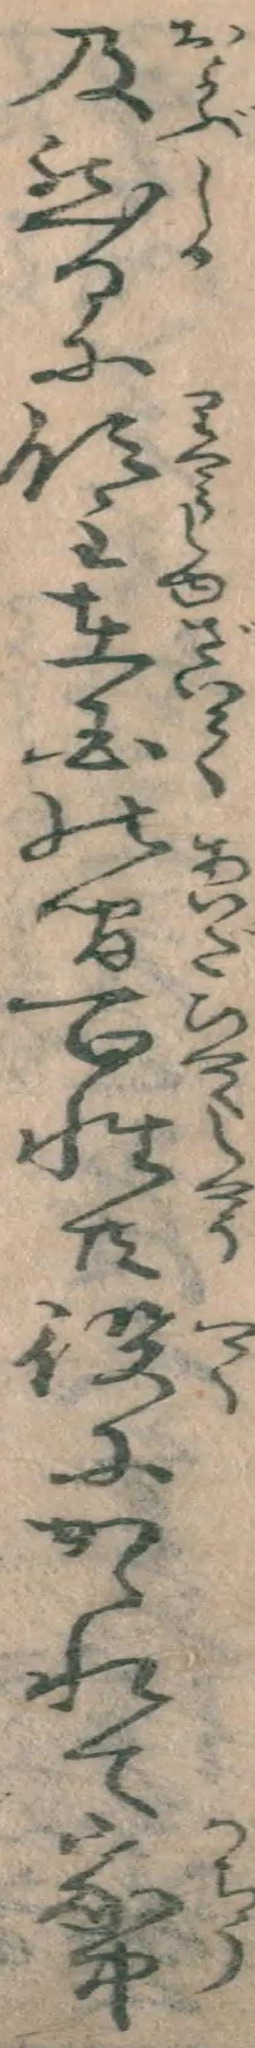及然るに領主在国の間百姓共役にかゝれて家中
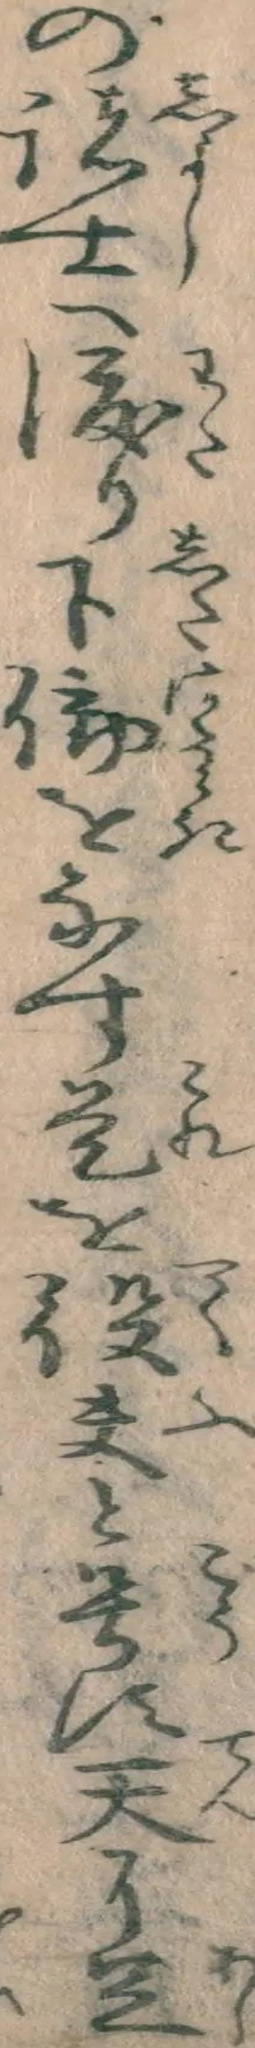の諸士へ渡り下働をなす是を役夫と号す天に足
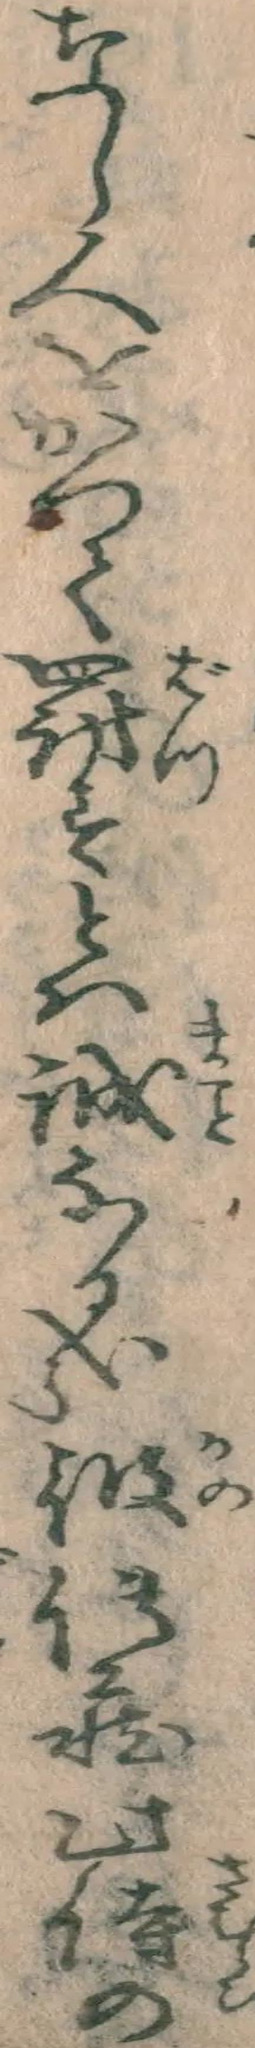なし人をかつ？て罰すとは誠なる哉彼伝蔵此侍の
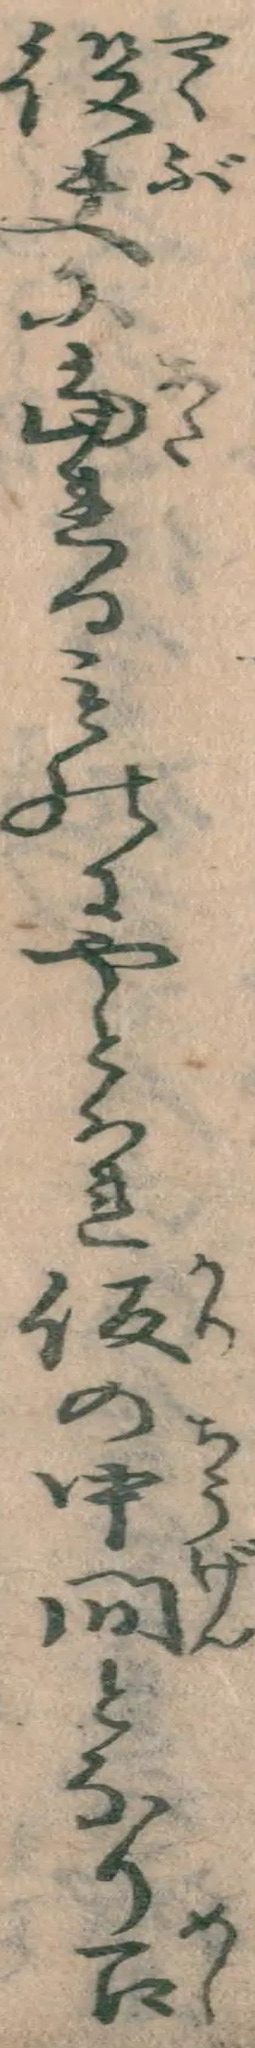役夫に当れるものにやとはれ仮の中間となり召
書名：怪談御伽童 5巻. [2]
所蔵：国立国会図書館 National Diet Library, JAPAN
